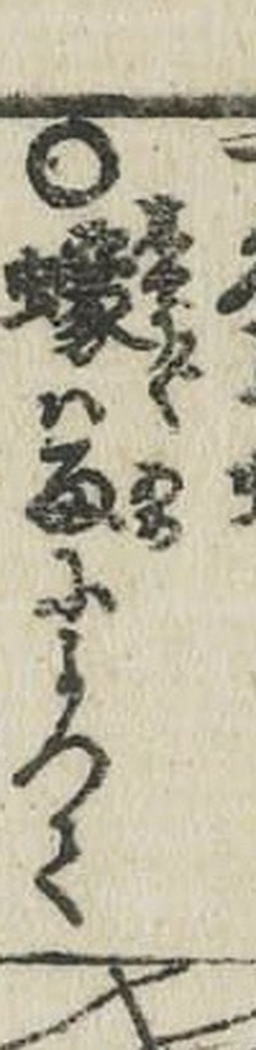○蠓は雨によつて
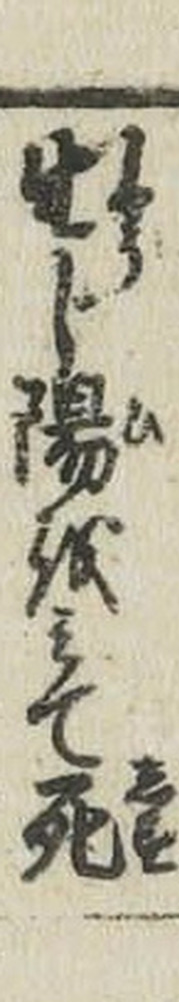生じ陽をみて死
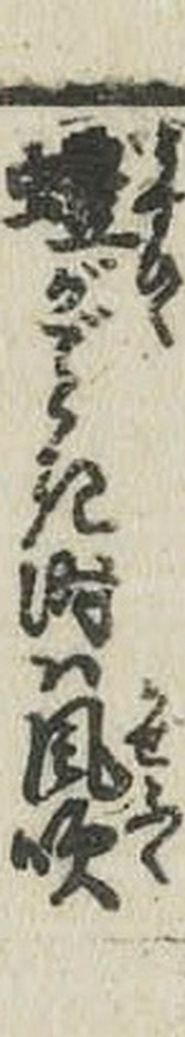がでかき時は風吹
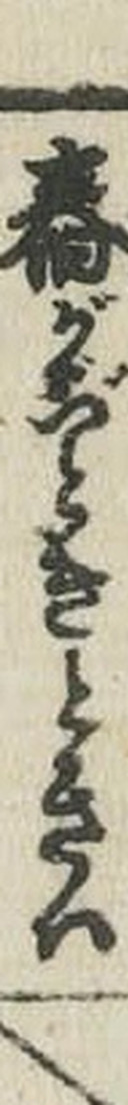舂がごときときは
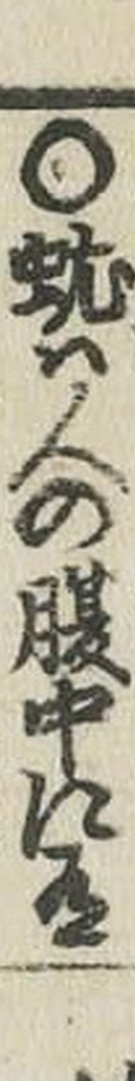○蚘は人の腹中に有
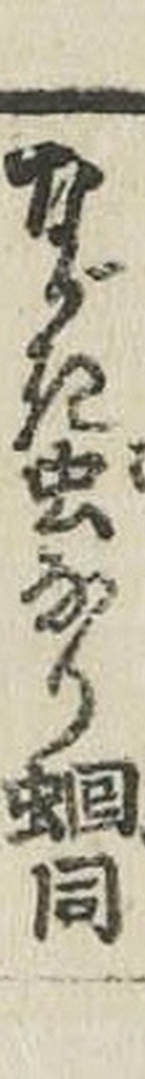ながき虫なり蛔同
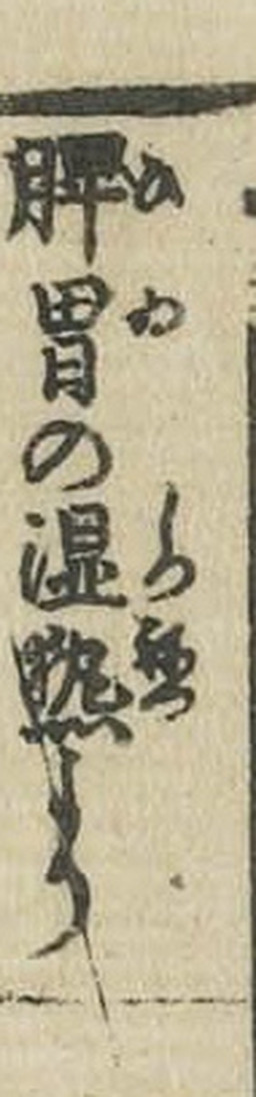脾胃の湿熱より
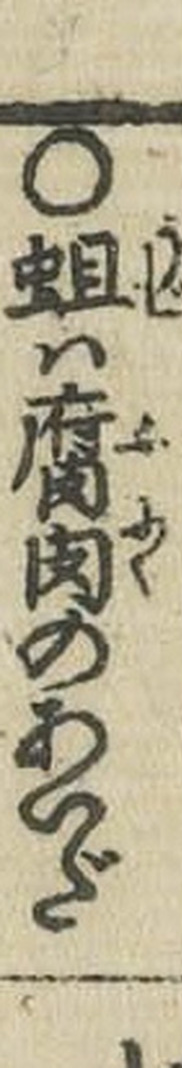○蛆は腐肉のあいだ
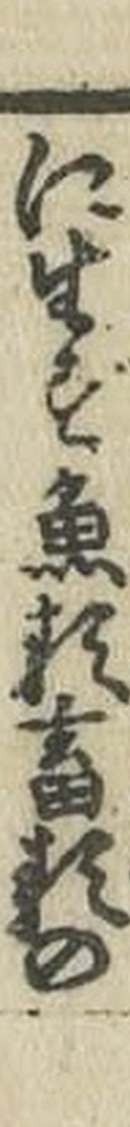に生ず魚類畜類の
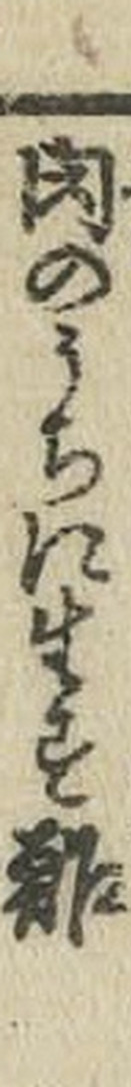肉のうちに生す鮓
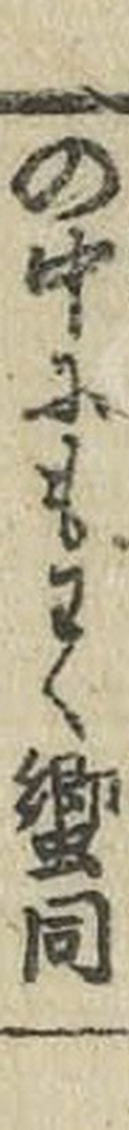の中にもわく蠁同
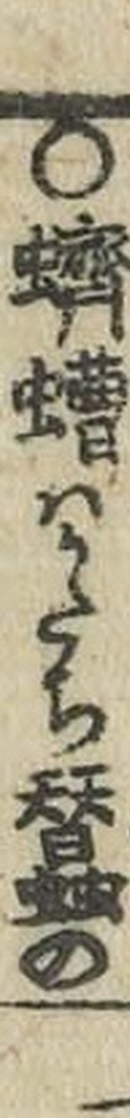○蠐螬はかたち蚕の
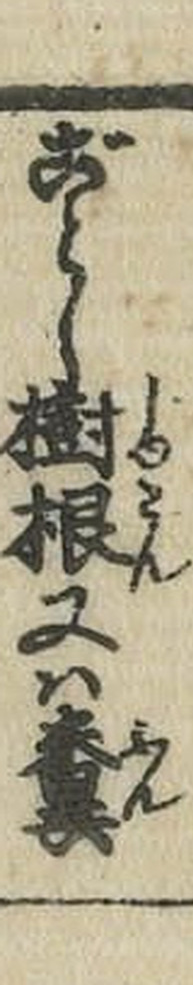ごとし樹根又は糞
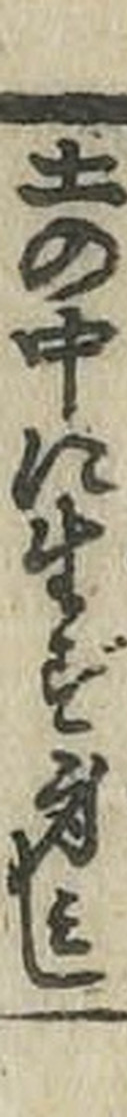土の中に生ず身みし
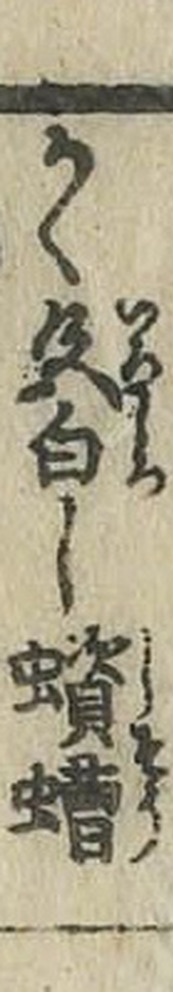かく色白し蠀螬
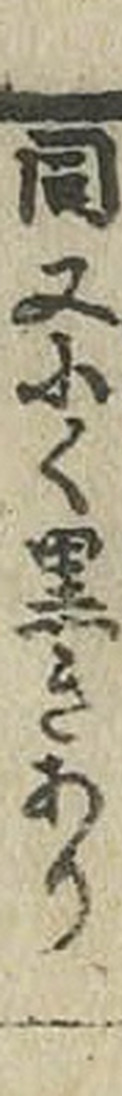同又小く黒きあり
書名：増補頭書訓蒙図彙大成 10巻 7:巻之14-16
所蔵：東京学芸大学教育コンテンツアーカイブ
